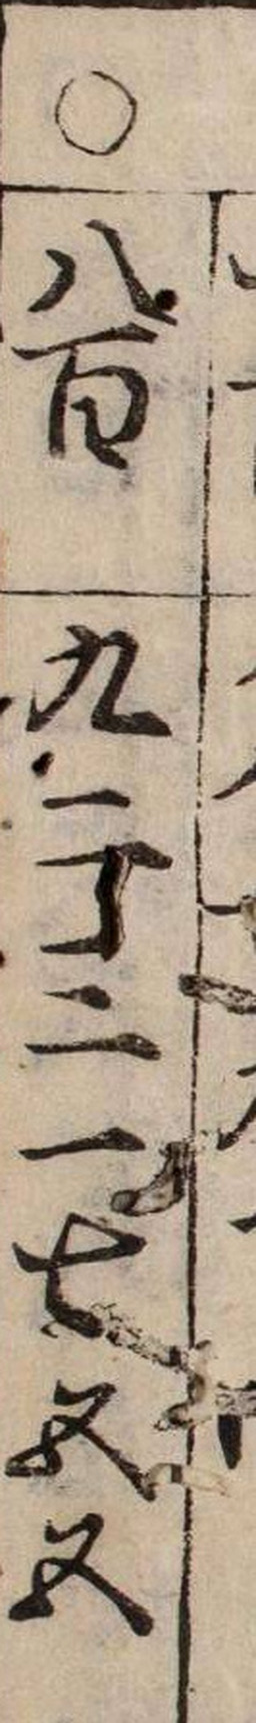○八百九二三一七五五

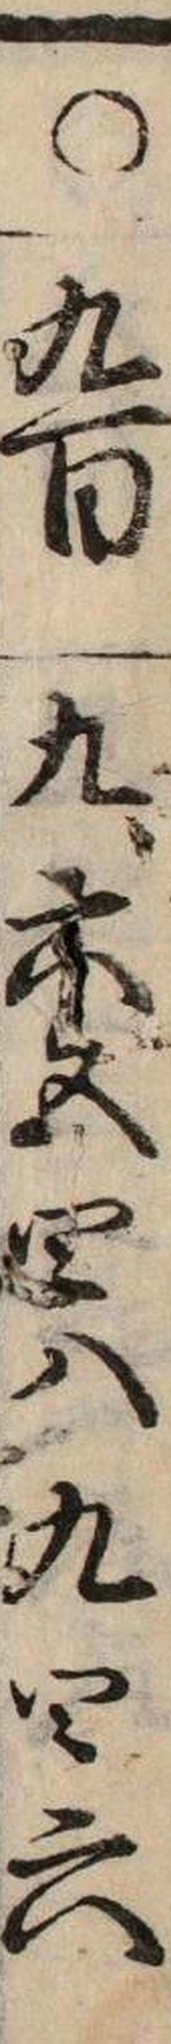○九百九六五四八九四六
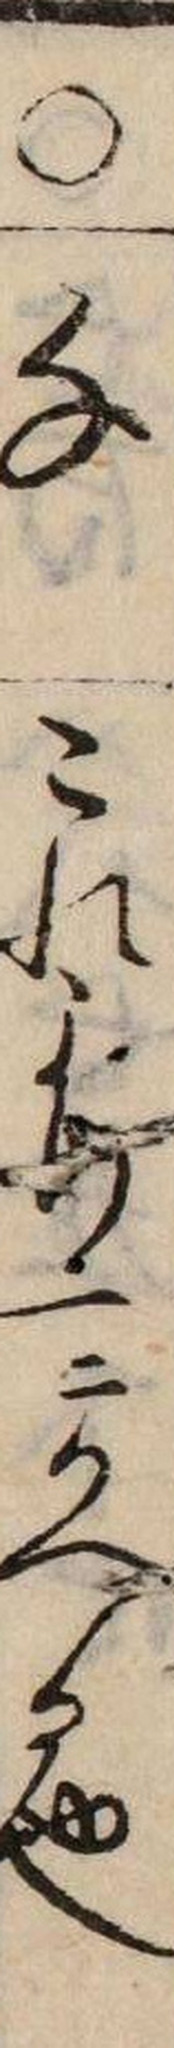○千これより一にかへる也
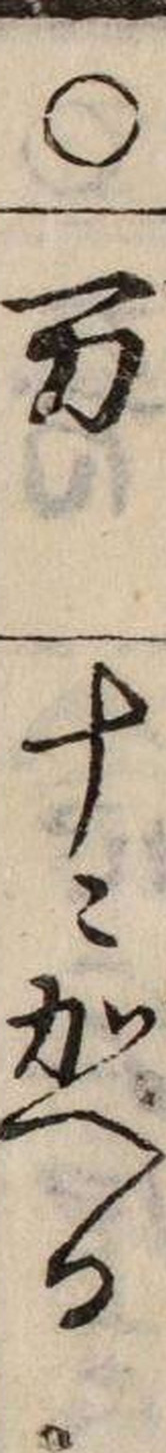○万十に加へる
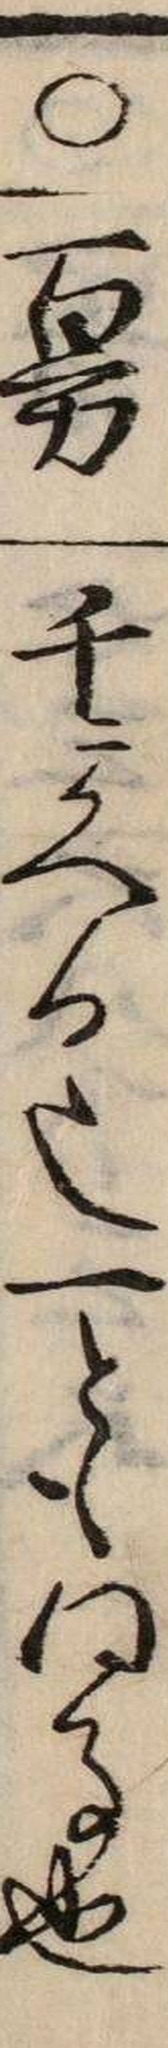○百万千にかへる也一とも同事也
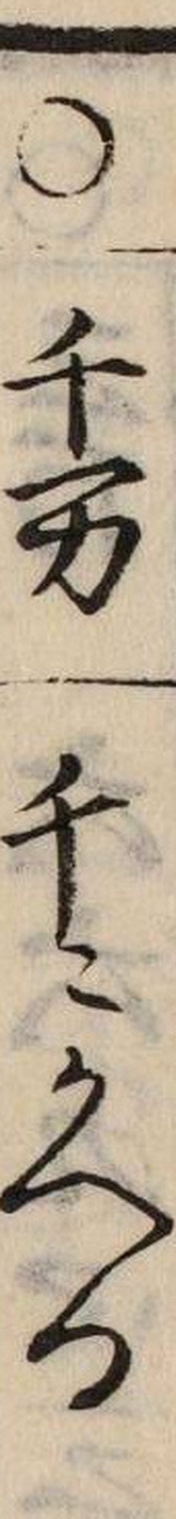○千万十にかへる
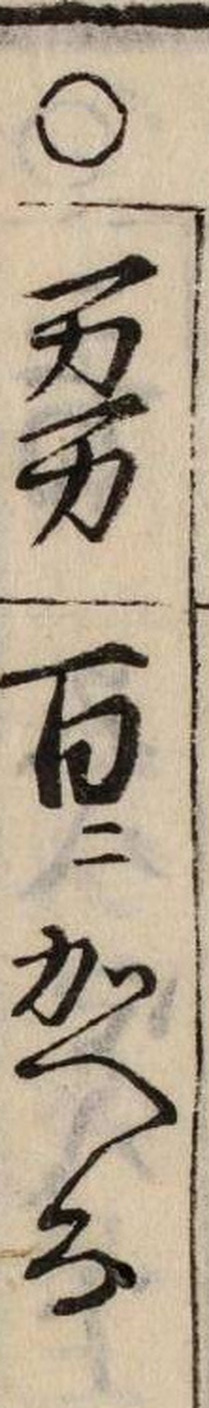○万万百に加へる
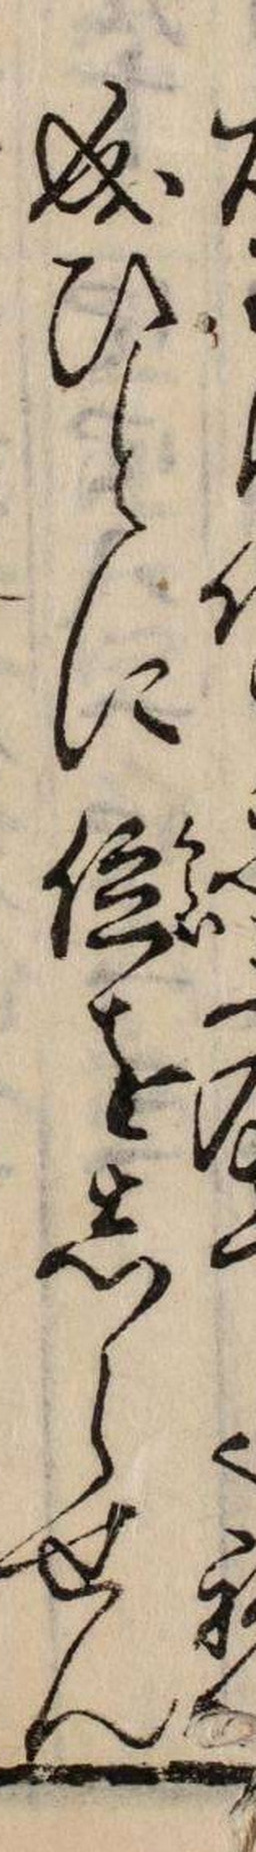成ひとに位をしらせん
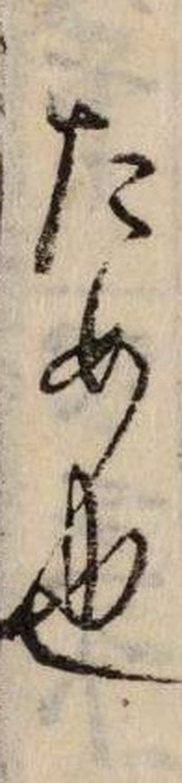ため也

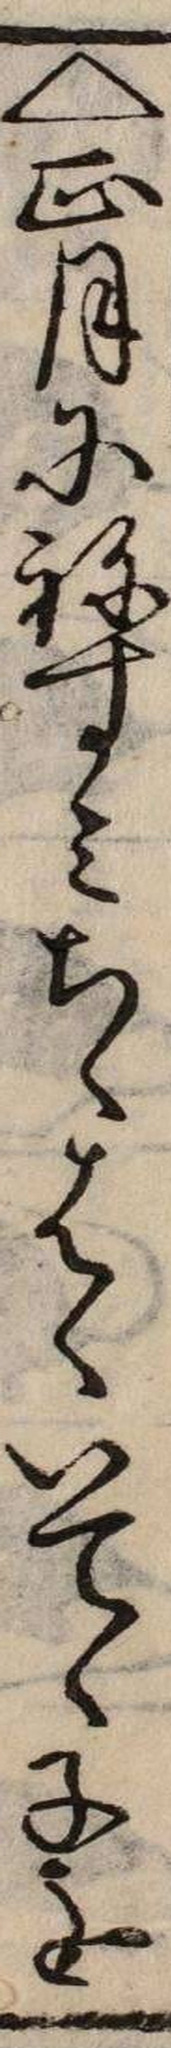△正月にねすみちちはくいてて子を
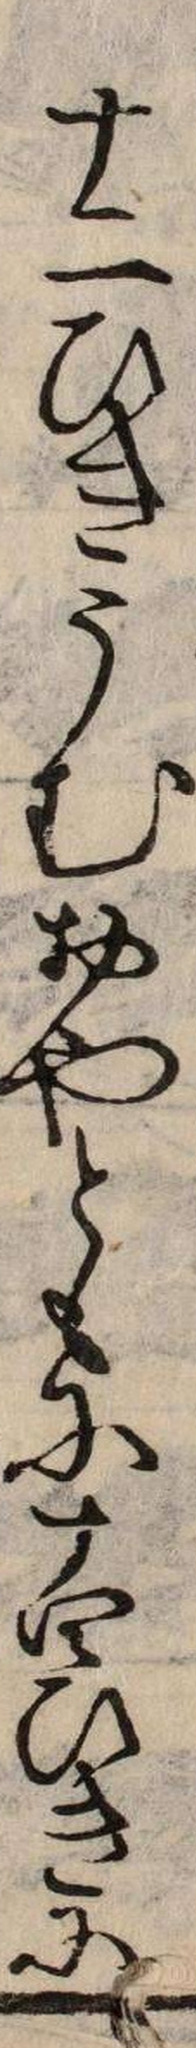十二ひきうむおやともに十四ひきに
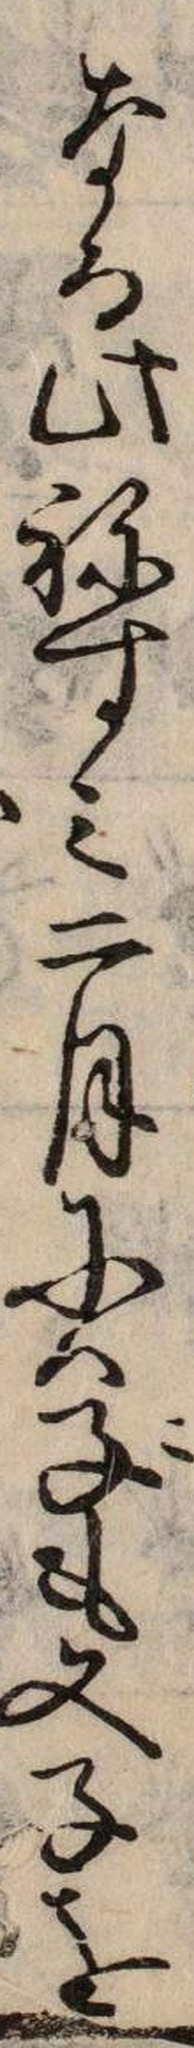なる此ねすみ二月には子も又子を
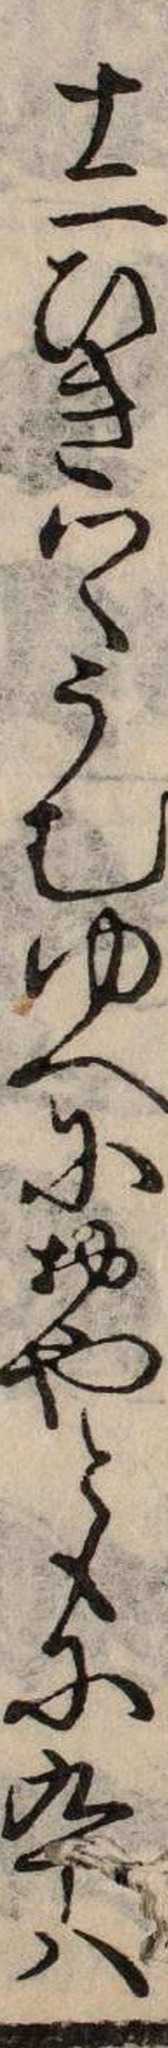十二ひきつつうむゆへにおやともに九十八
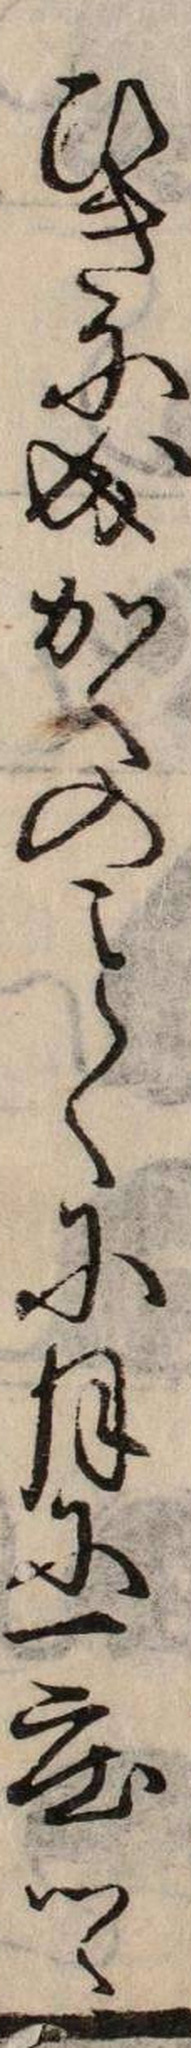ひきに成かんのことくに月に一度つつ
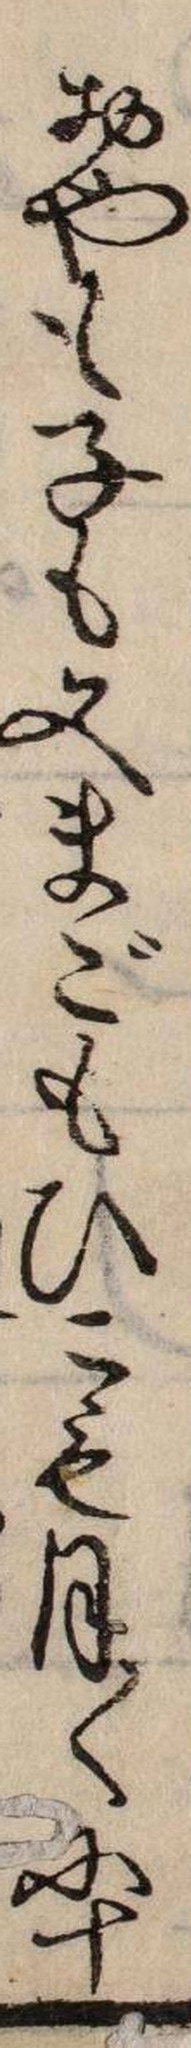おやも子も又まごもひこも月〳〵に十
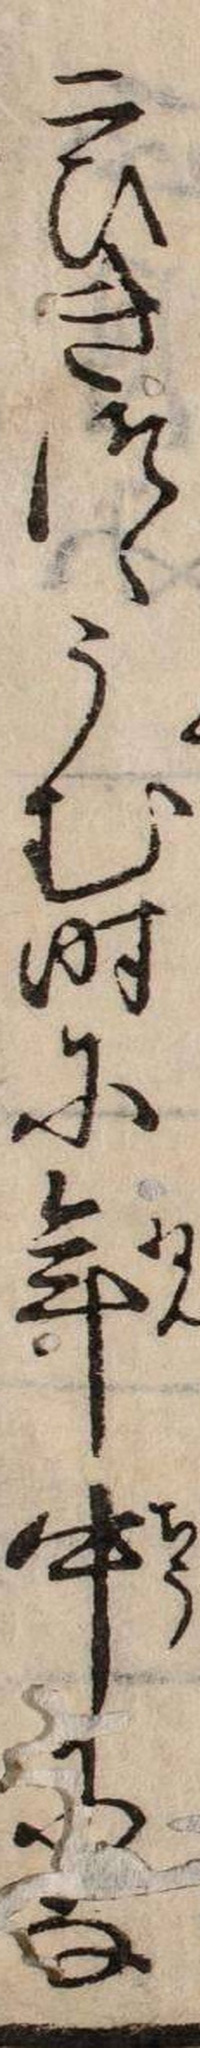二ひきつつうむ時に年中にな
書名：塵劫記（寛永11年自跋、京都府立京都学・歴彩館追貴8）
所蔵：京都府立京都学・歴彩館 国文学研究資料館
